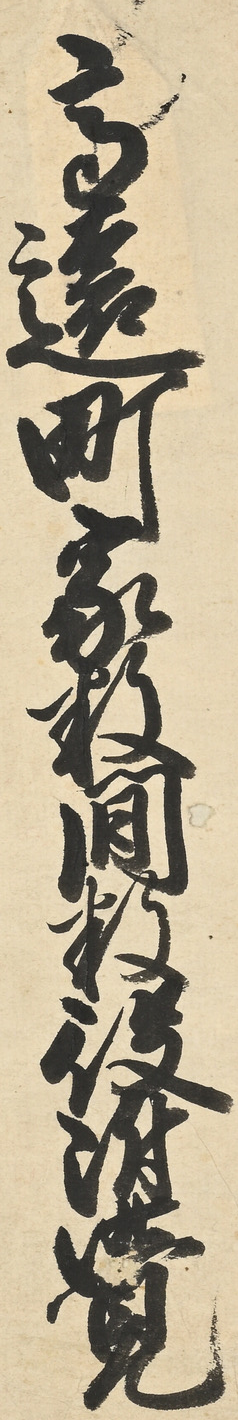高遠町家数間数役附覚

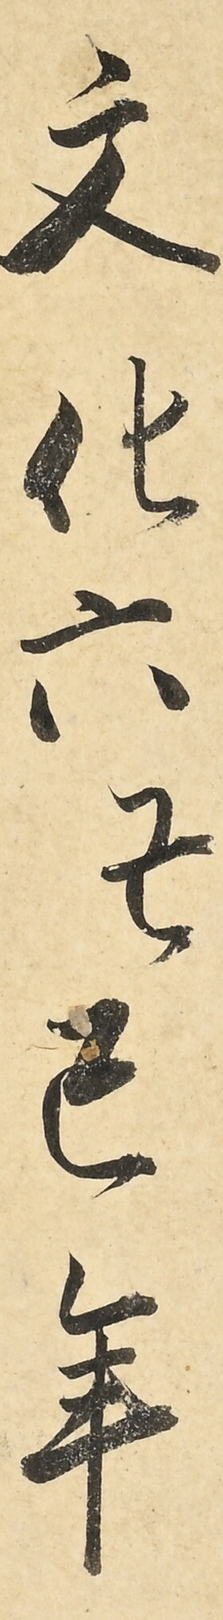文化六己巳年
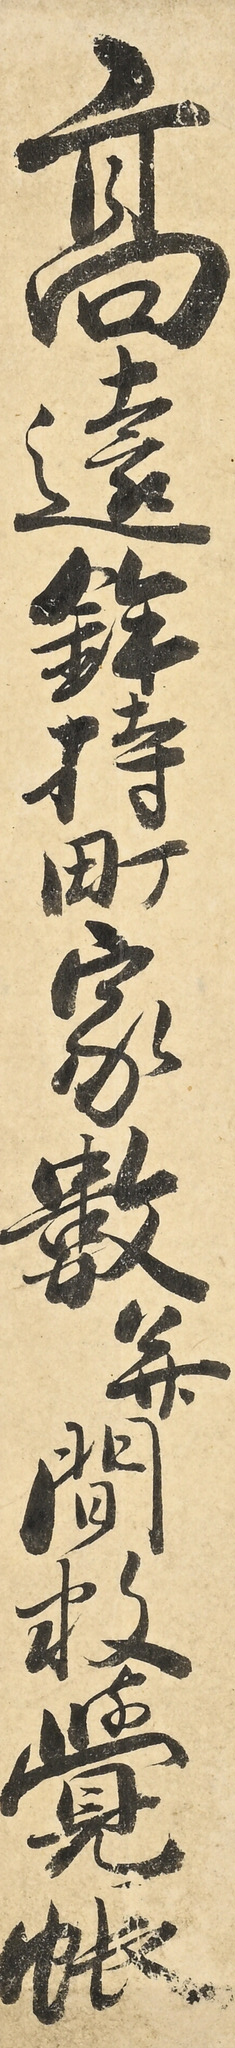高遠鉾持町家数并間数覚帳
